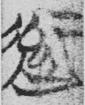○（帥）
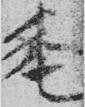帀（師）
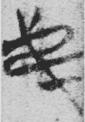弟
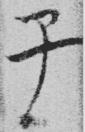子
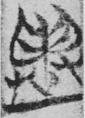○（輿）
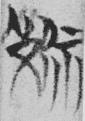○（屍）
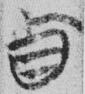貞
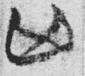凶
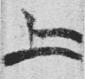上
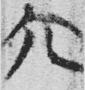六
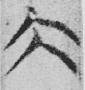大
